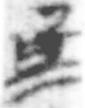爲
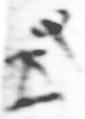○（右）
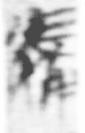○（服）
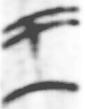王
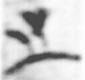之
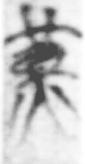黃
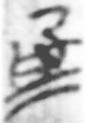爲
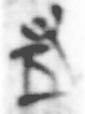○（右）
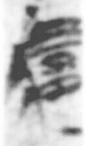驂
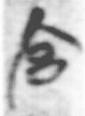宮
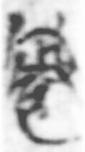廏
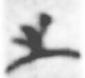之
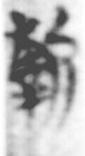新（新）
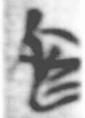官
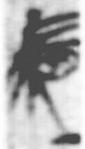駟
